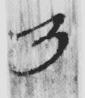乃
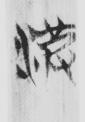波
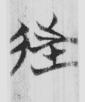{彳之𡈼}
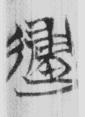{辶帚}
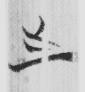之
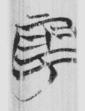𩁹
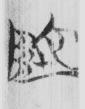地
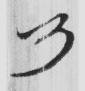乃
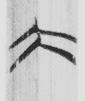大
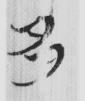多
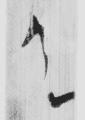人
